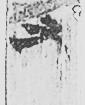又
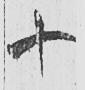七
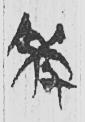年
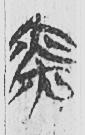赤
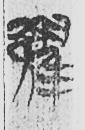{翟阝}
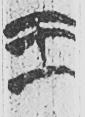王
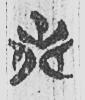峁
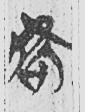唬
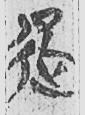起
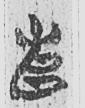{山𡴎}
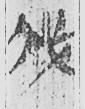伐
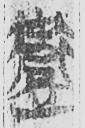{衛止}
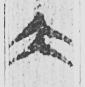大
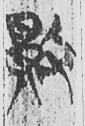敗
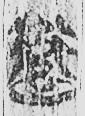{衛止}
